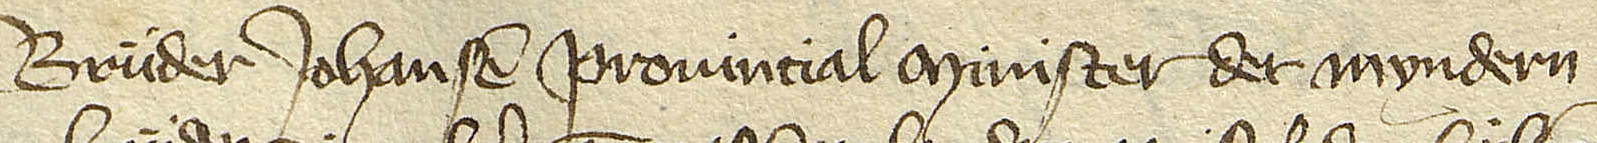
Brüder Iohanſe* Prouincial Miniſter der myndern
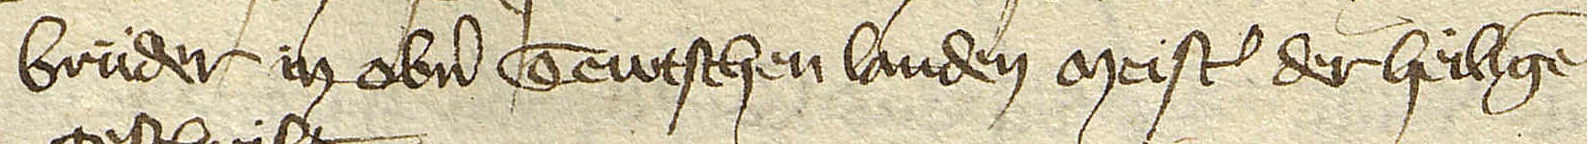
brüder in obn* Tewtſchen landen Meiſt* der heilige*
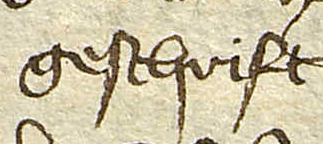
geſchrift
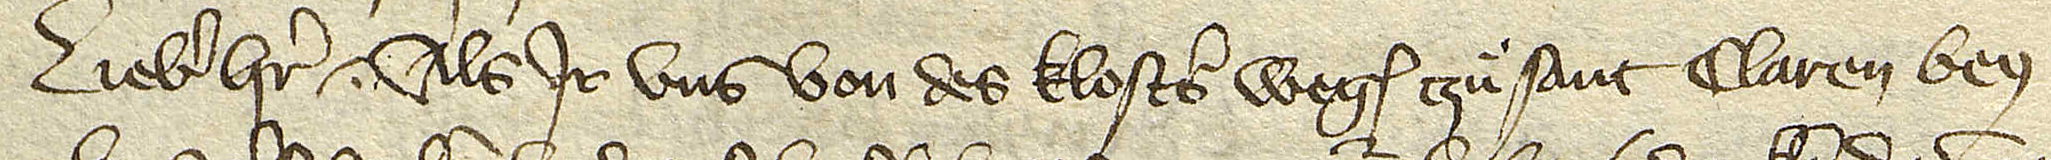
Lieb* hr* / . Als Ir vns von des kloſts* weg* cʒü ſant Claren bey
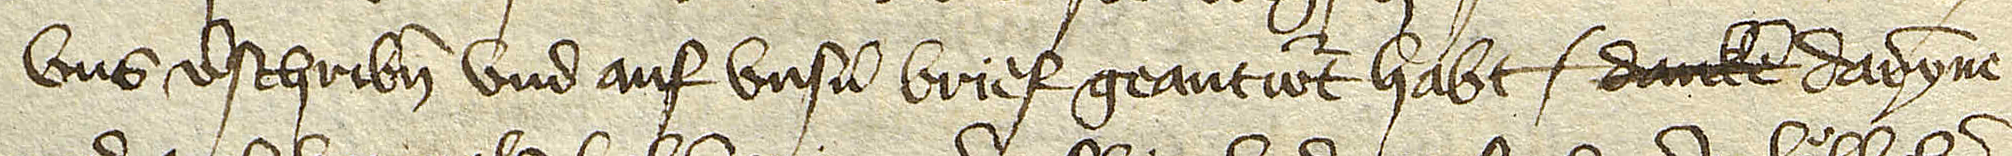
vns v*ſchribn* vns auf vnſn* brief geantw*t habt / danke* dar*yne
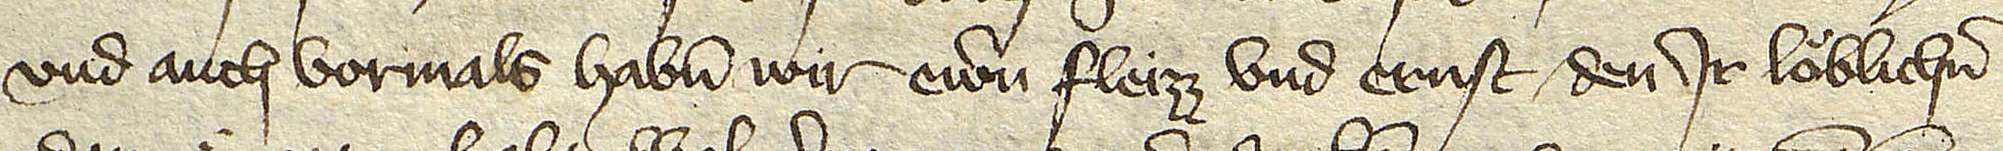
vnd auch vormals habn* wir ewn* fleiʒʒ vnd ernſt / den Ir löblichn*
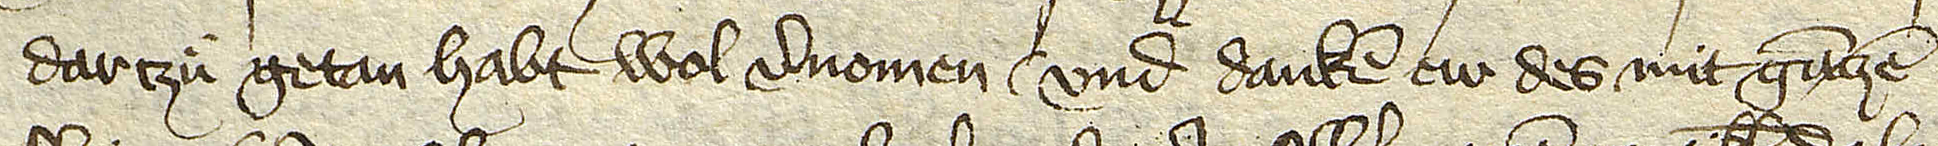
darcʒü getan habt wol v*nomen / vnd danke* ew des mit ga*cʒe*
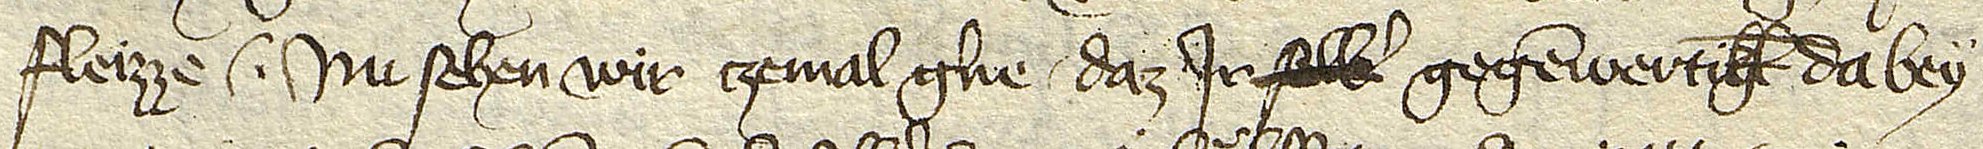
fleiʒʒe / . Nu ſehen wir cʒemal g*ne / daʒ Ir ſelb* gege*wertikl* dabey
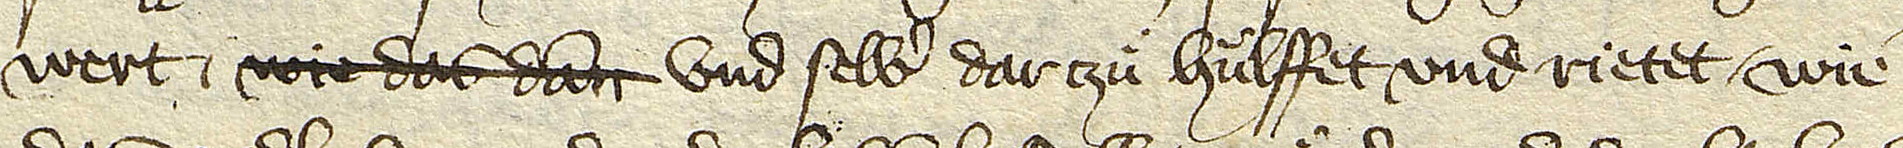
wert / wie das dan* vnd ſelb* dar cʒü hülffet vnd rietet / wie
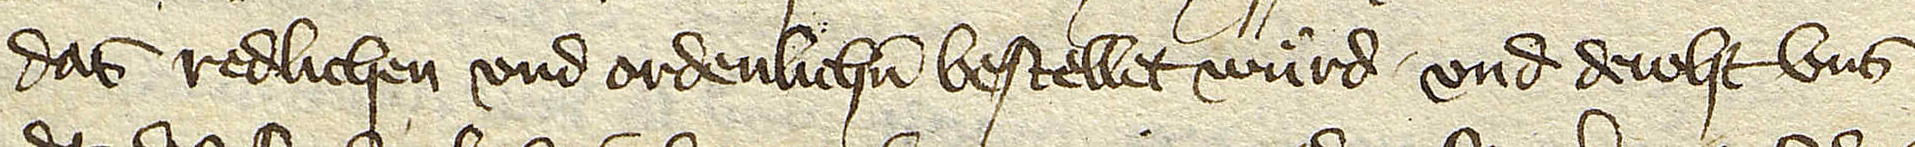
das redlichen vnd ordenlichn* beſtellet würd / vnd dewht vns
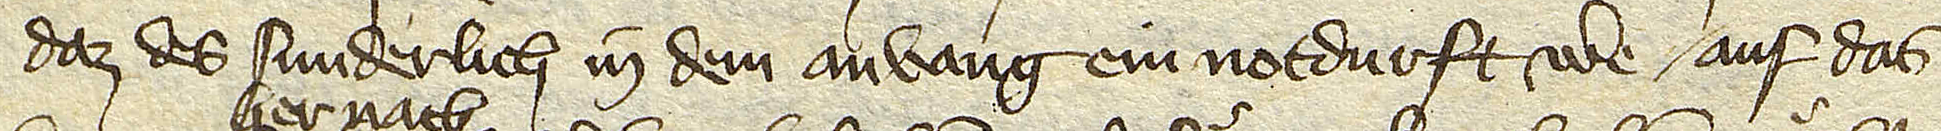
daʒ des ſunderlich in dem anvang ein notdurft w*e / auf das
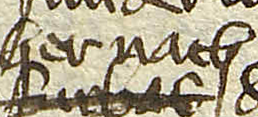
her nach
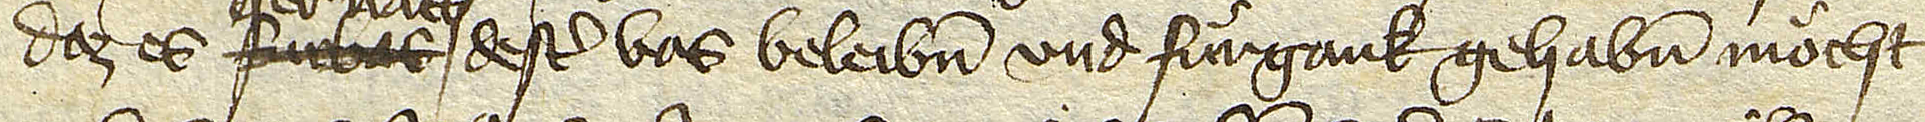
daʒ es furbas deſt* bas beleibn* vnd fürgank gehabn* möcht
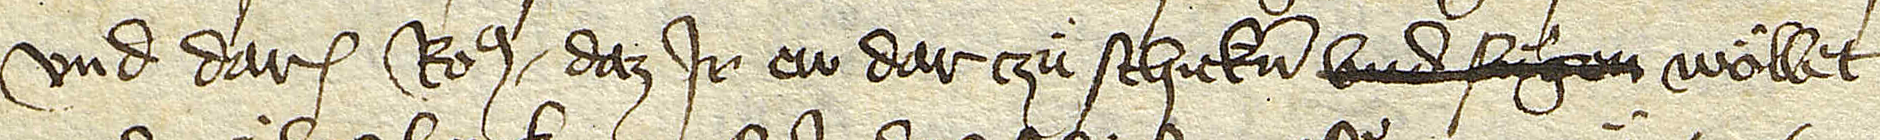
vnd dar* Ro* / daʒ Ir ew dar cʒü ſchickn* vnd fügen wöllet
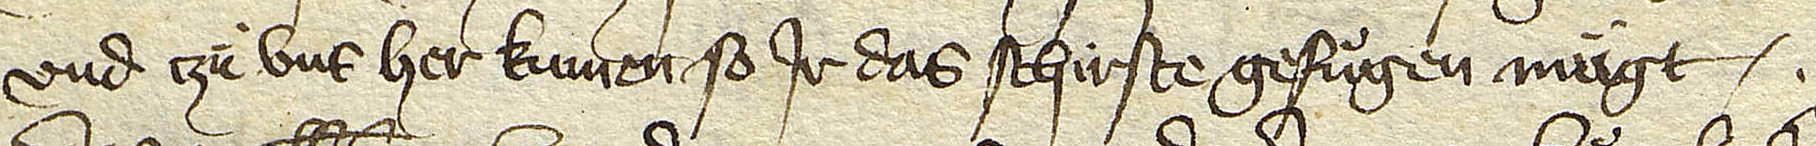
vnd cʒü vns her kumen / ſo Ir das ſchirſte gefügen mügt / .
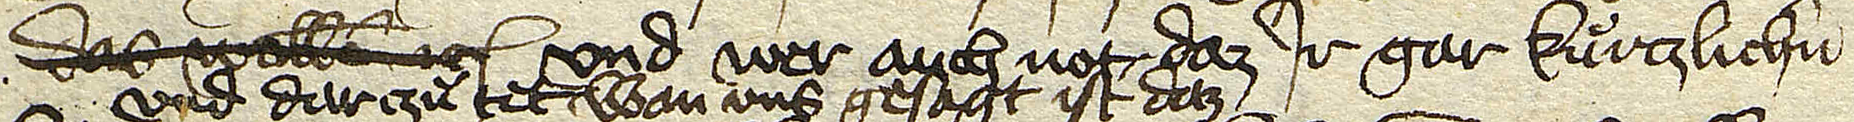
das wolle* ec* vnd wer auch not / daʒ Ir gar kürcʒlichn*
